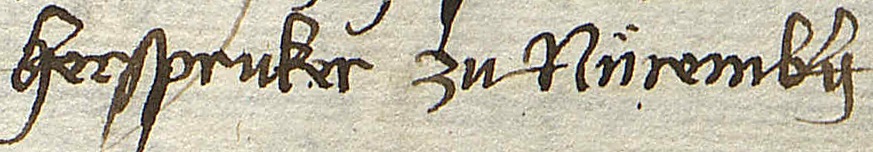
Herſpruker ʒu Nüremb*g
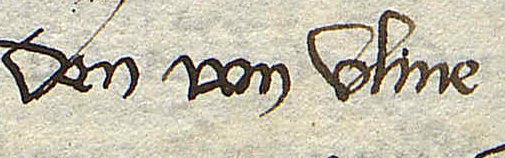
Den von Vlme
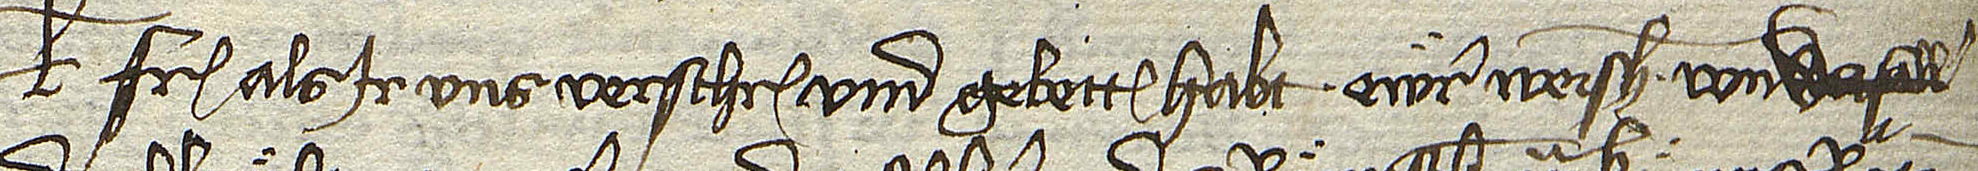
L* Fr* als Ir vns verſchr* vnd gebett* habt ew*r weiſh* von Vnſall*
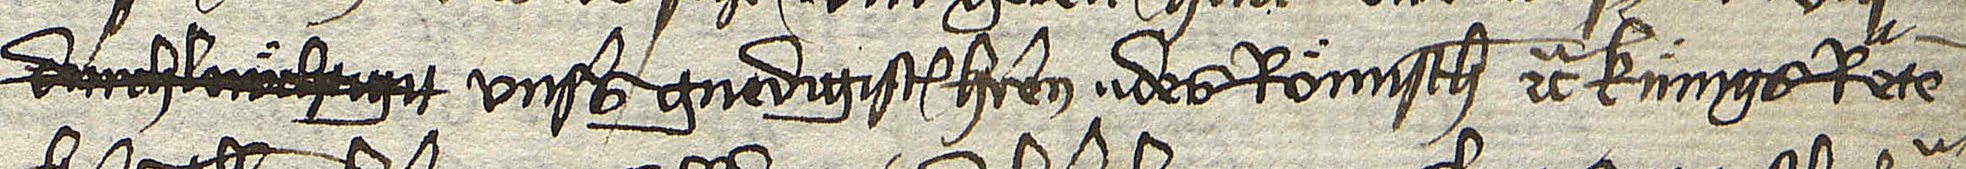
durchlewchtigit vnſ*s gnedigiſt* h*ren ~ des Römiſch* ec* künigs Rëte*
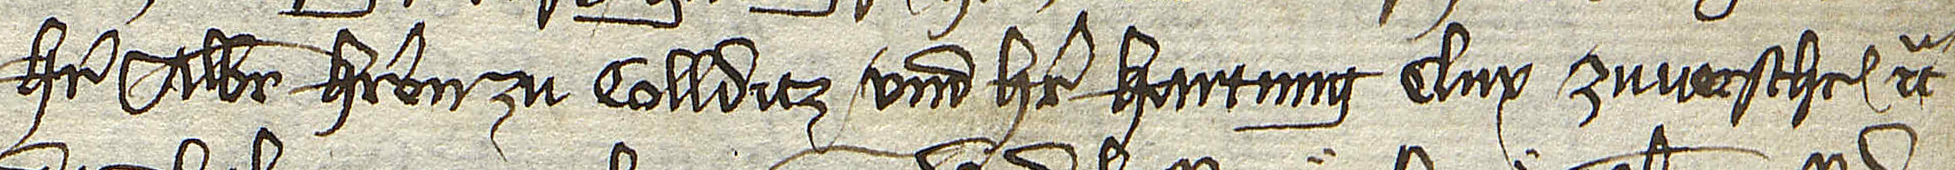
H*r Albr* h*ren ʒu Colldicʒ / vnd h*r Hartung Clux / ʒuuerſchr* ec*
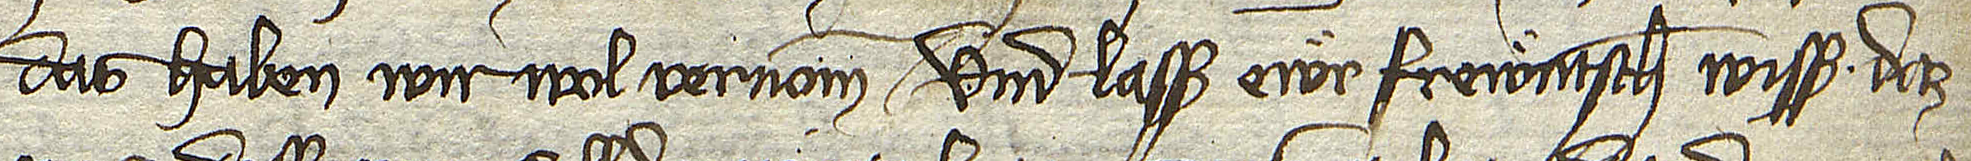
Das haben wir wol vernom* / Vnd laſſ* ewr frewntſch* wiſſ* . daʒ
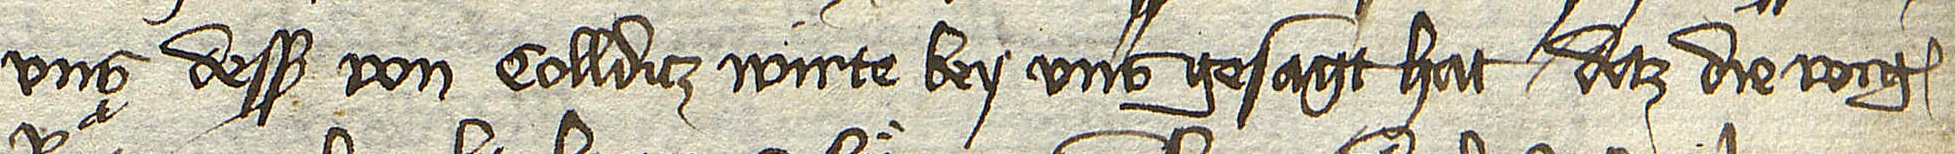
vns deſſ* von Colldicʒ wirte bey vns geſagt hat / daʒ die vorg*
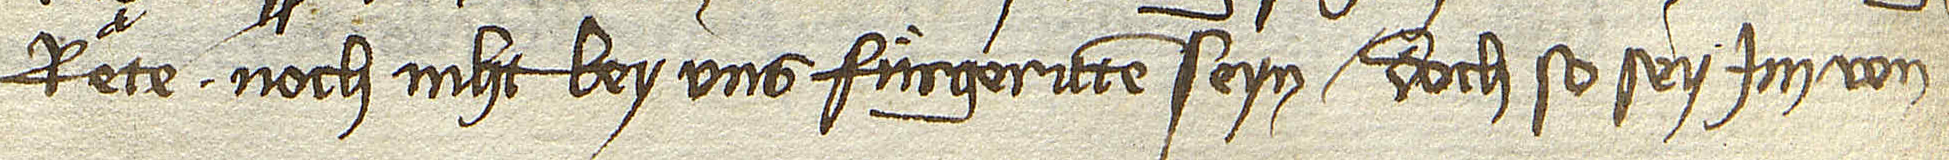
Rëte . noch niht bey vns fürgeritte* ſeyn / doch ſo ſey Im von
